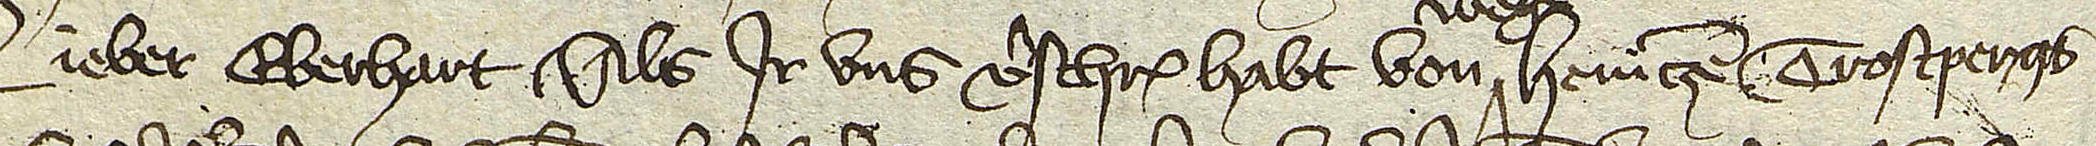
Lieber Eberhart / Als Ir vns v*ſchr* habt von heincʒe* Troſtpergs
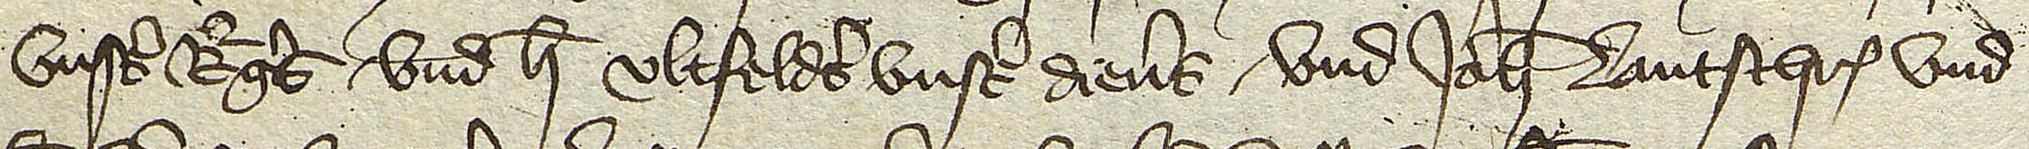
vnſs* B*g*s / vnd h* vltfelds* vnſs* dien*s Ioh* Lantſchr* vnd
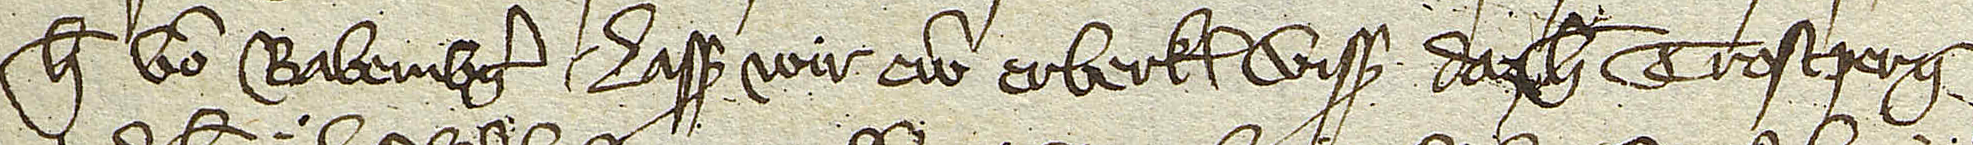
h* vo* Babembg* / Laſſ* wir ew* erberk* wiſſ* . daʒ h* Troſtperg
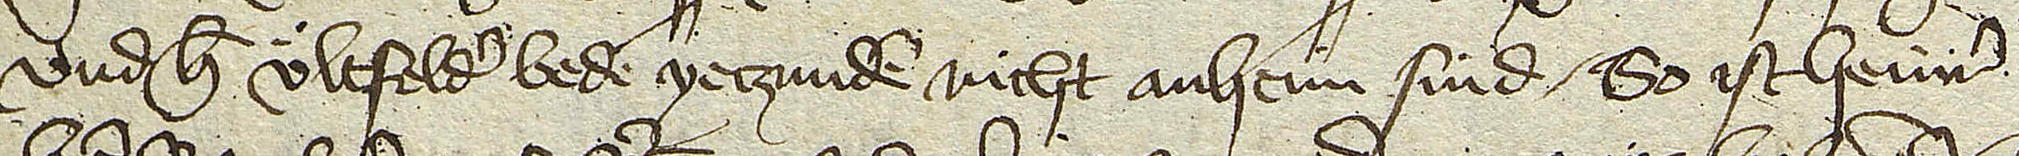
vnd h* v̈ltfeld bede yecʒunde* nicht anheim ſind / So iſt heinr*
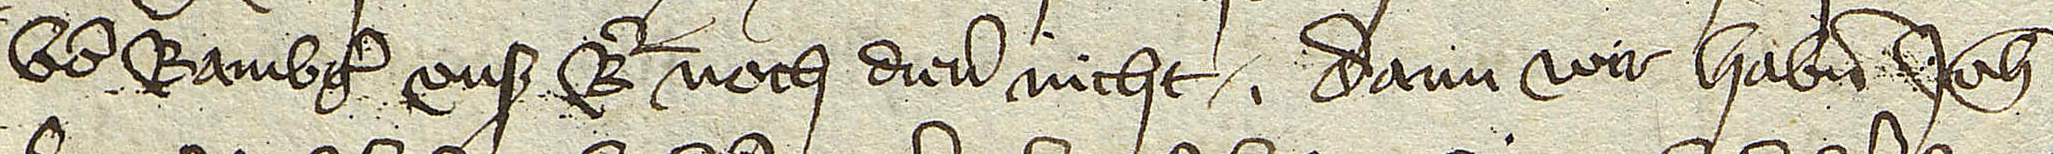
vo* Bambg* vnſ* B* noch dien* nicht / . Dann wir habn* Ioh*
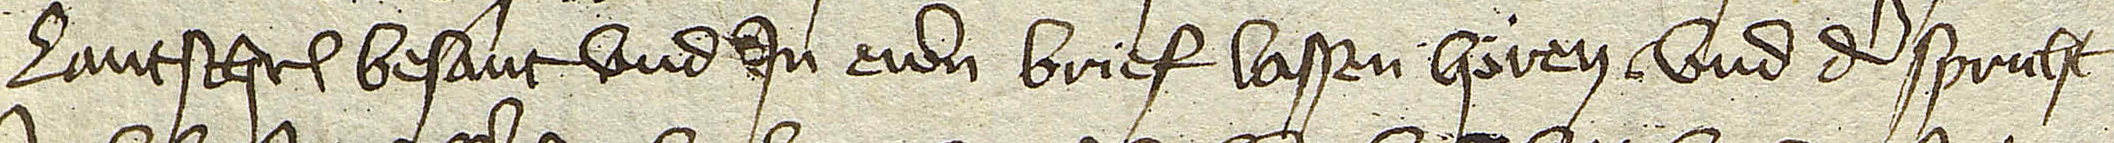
Lantſchr* beſant vnd In ew*n brief laſſen hören / vnd d* ſpricht
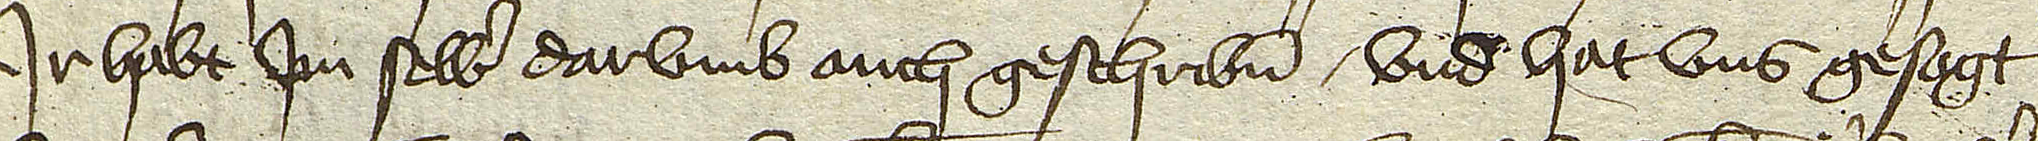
Ir habt Im ſelb* darvmb auch geſchribn* / vnd hat vns geſagt
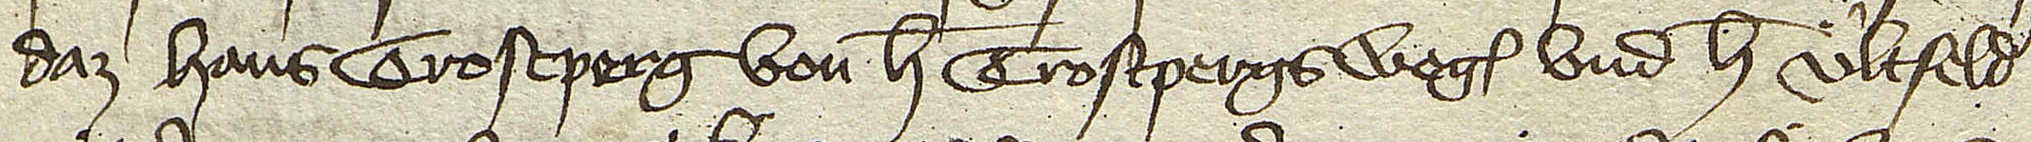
daʒ hans Troſtperg von h* Troſtpergs weg* vnd h* v̈ltfeld*
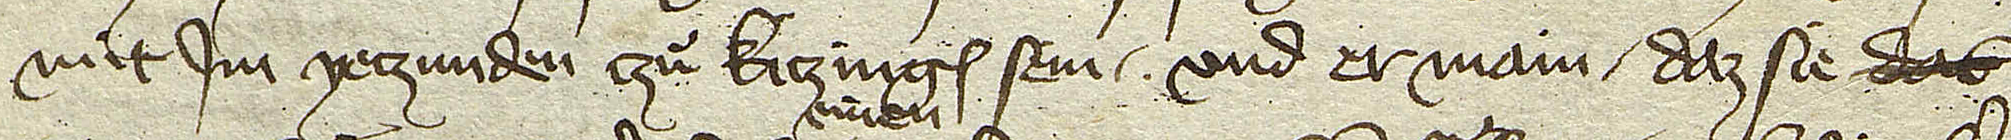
mit Im yecʒunden cʒü Kicʒing* ſein / . vnd er main / daʒ ſie das
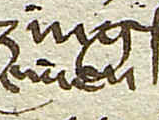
einen
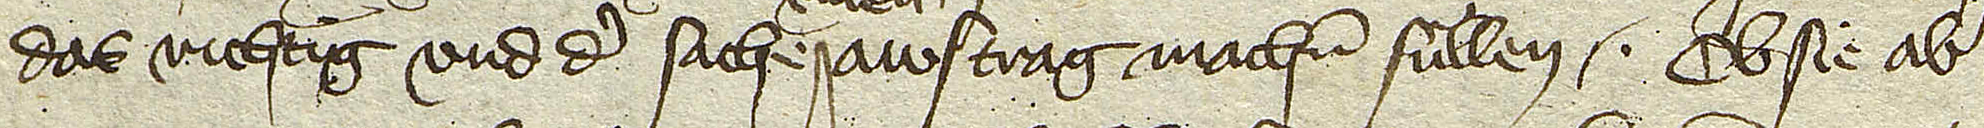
das richtig vnd d* ſache awſtrag machn* ſüllen / . Ob ſie ab*
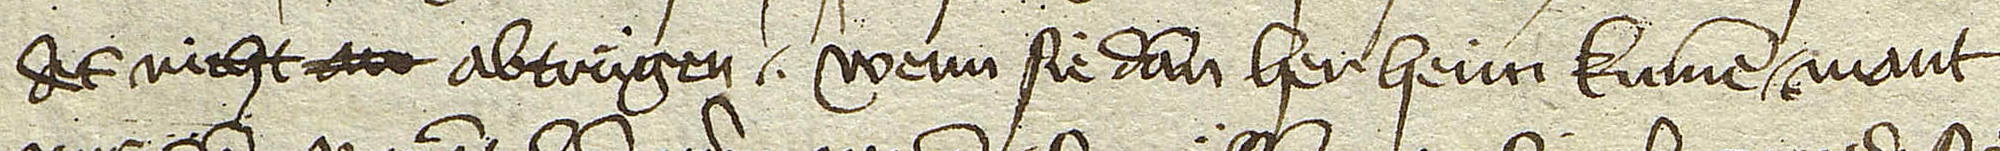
des nicht aw abtrügen / . wenn ſie dan* her heim kume* / mant
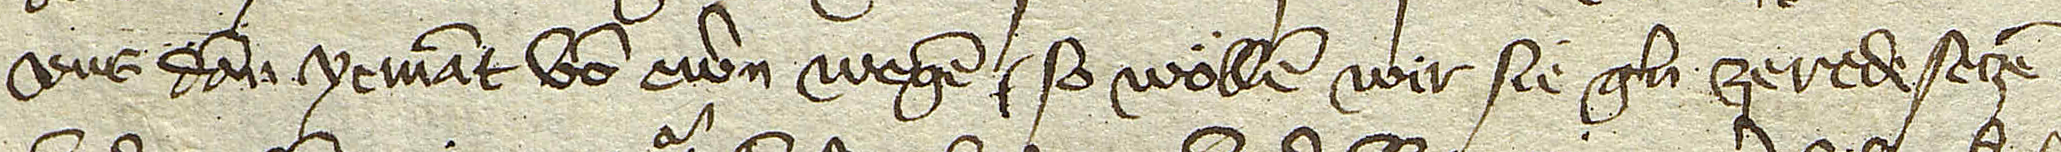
vns dan* yemat* vo* ew*n wege* / ſo wölle* wir ſie g*n cʒerede ſecʒe*
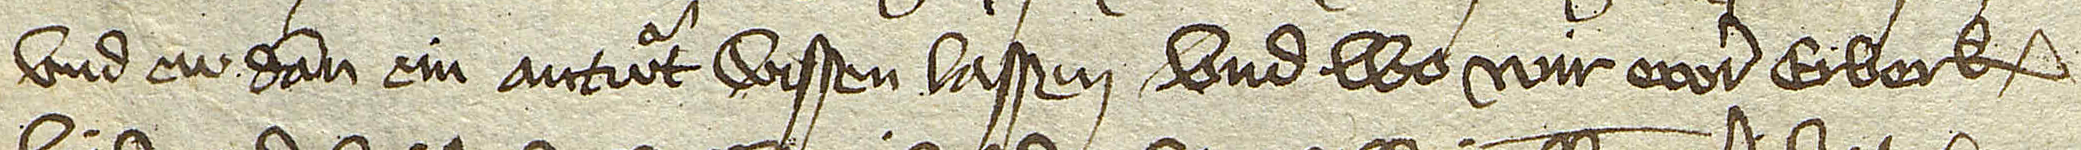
vnd ew dan* ein antw*t wiſſen laſſen / vnd wo wir ewn* Erberk*
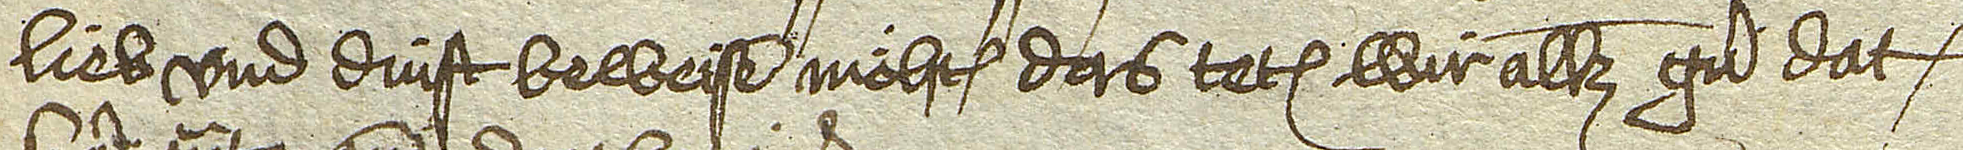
lieb vnd dinſt beweiſe* möht* das tet* wir allcʒ* gn* dat*
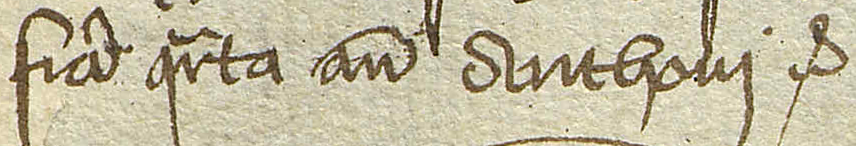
fia* qrta* an* Anthoni §
